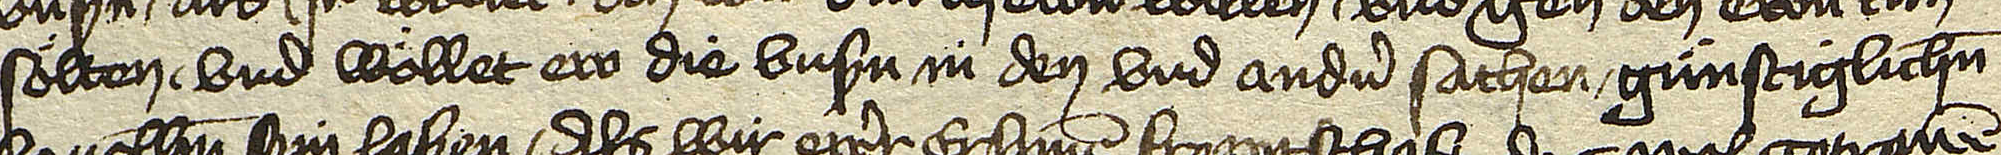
ſölten / vnd wöllet ew die vnſ*n in den vnd andn* ſachen / günſtiglichn*
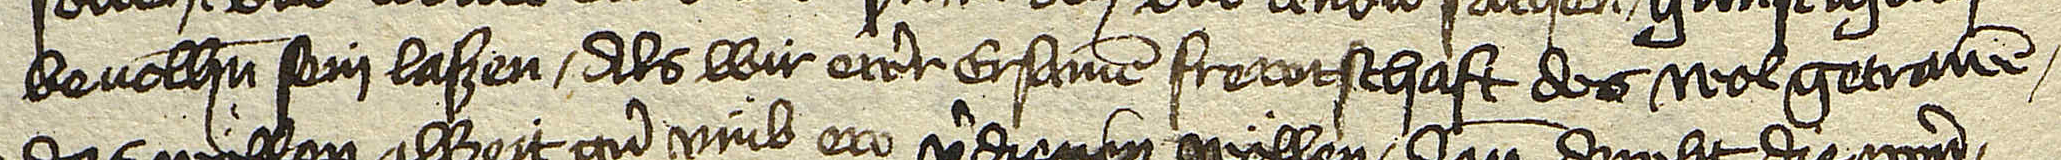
beuolhn* ſein laſʒen / Als wir ewr* Erſame* frewntſchaft des wol getrawe* /
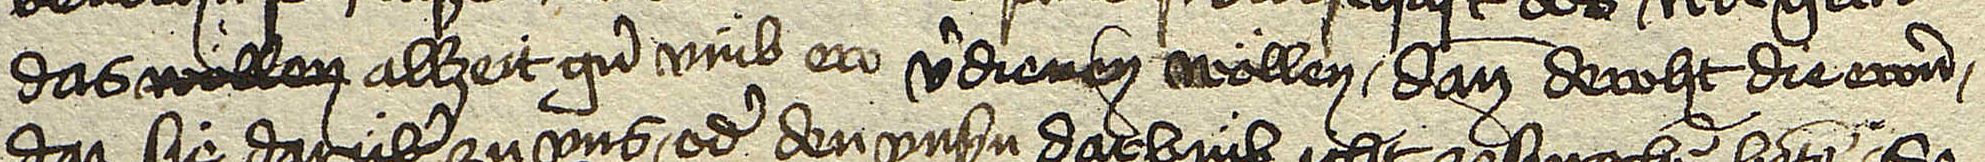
das wöllen allcʒeit gn* v̈mb ew v*dienen wöllen / dan* dewht die ewn* /
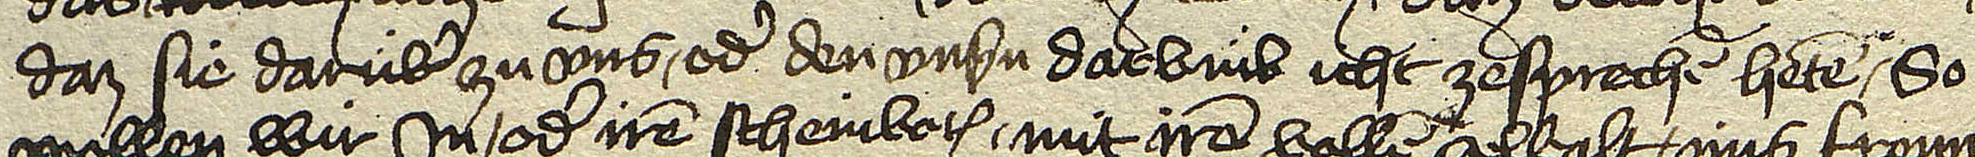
daʒ ſie darüb* cʒu vns / od* den vnſ*n darv̈mb icht cʒeſpreche* hete* / So
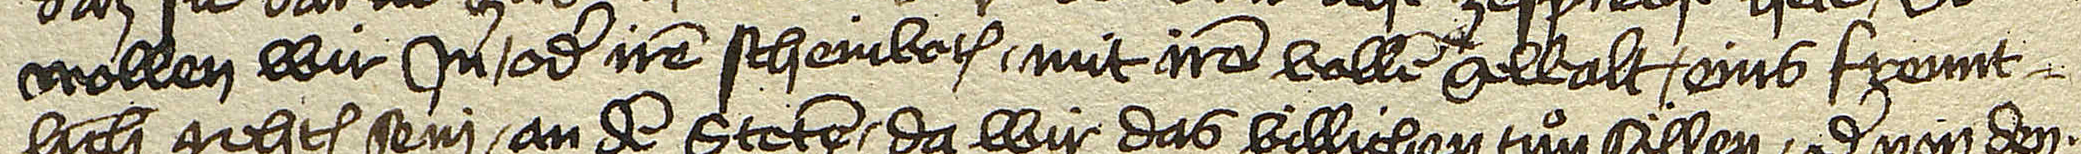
wollen wir In / od* ire* ſcheinbot* / mit ire* volle gewalt / eins freunt =
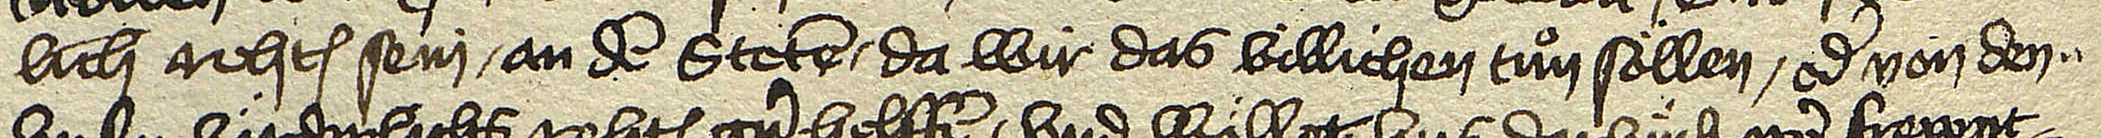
lich* reht* ſein / an d* Stete* / da wir das billichen tün ſöllen / od* von den ~
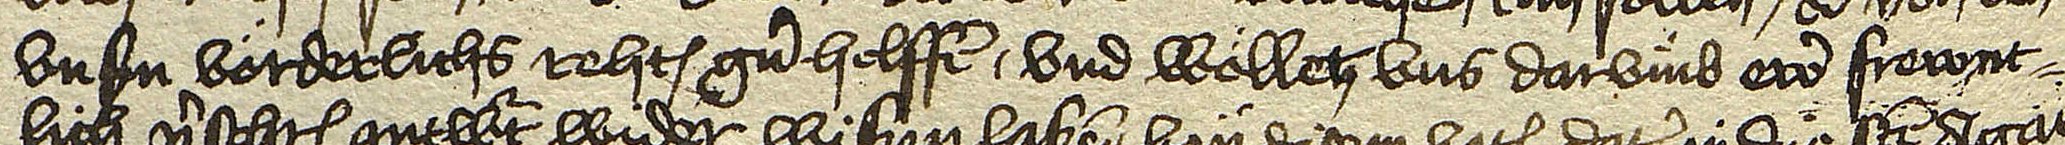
vnſ*n vörderlichs reht* gn* helffe* / vnd wöllen vnd darv̈mb ew* frewnt =
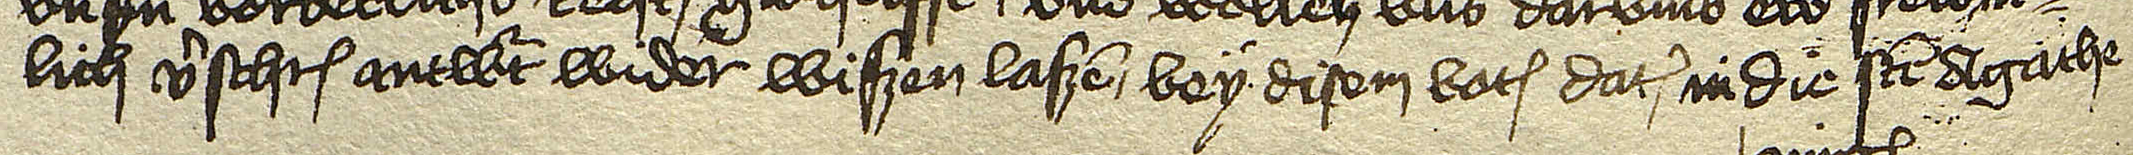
lich v*ſchr* antw*t wider wiſʒen laſʒe* / bey diſem bot* dat* in die ſce* Agathe
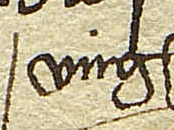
virg*
